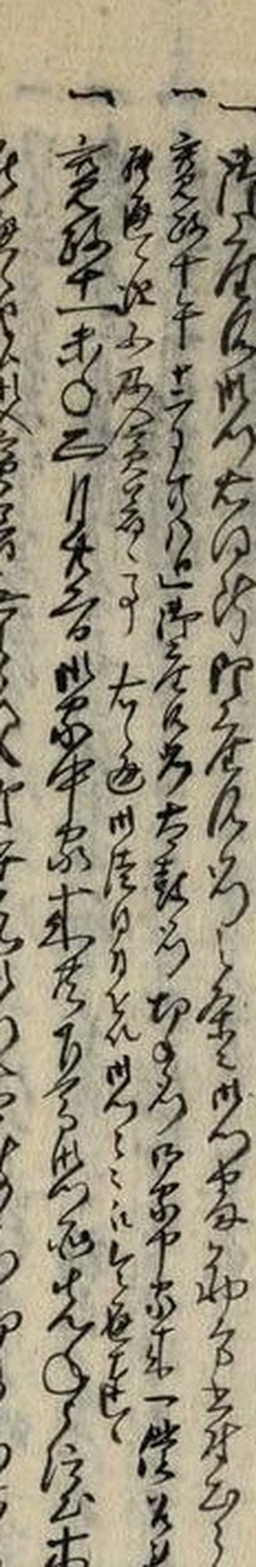罷通候儀不及貪着候事右之通御徒目付を以御門々々江令通達候
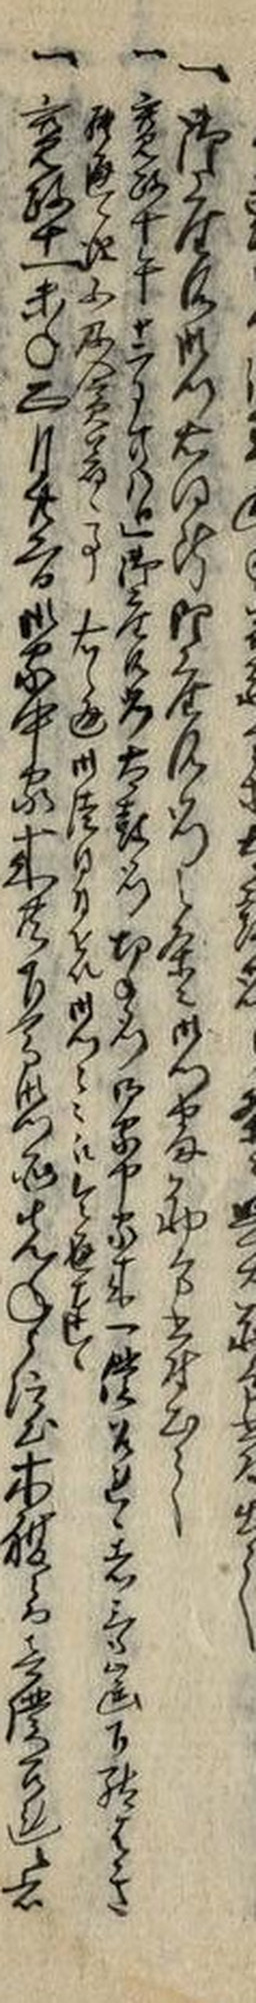一寛政十午十二月廿八日」御座所御門太鼓御門切手御門御家中家来一僕召連候者三ツ歯下駄はき
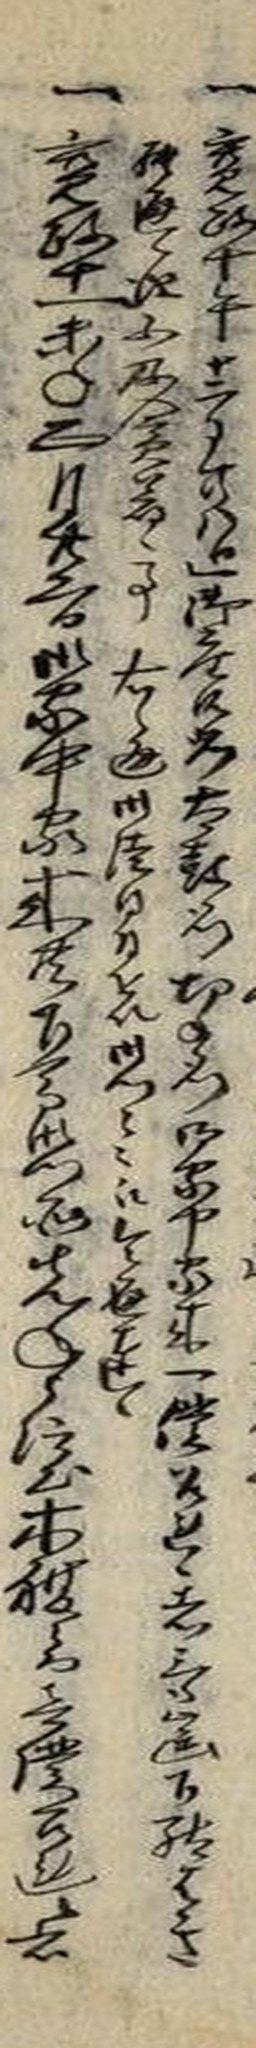一寛政十一未年正月廿二日御家中家来共下馬御門所先年被仰出木履に而壱僕召連候者
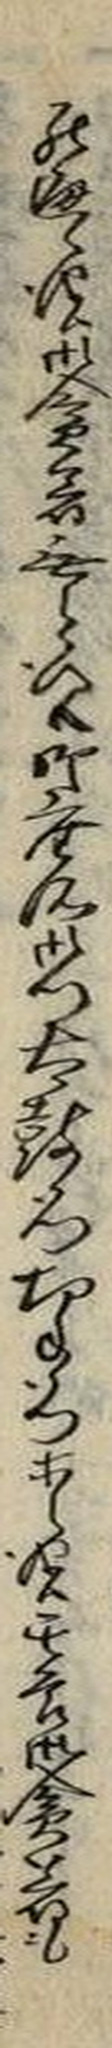罷通候儀は御貪着無之候得は御座所御門太鼓御門切手御門等之儀は其節御貪着も
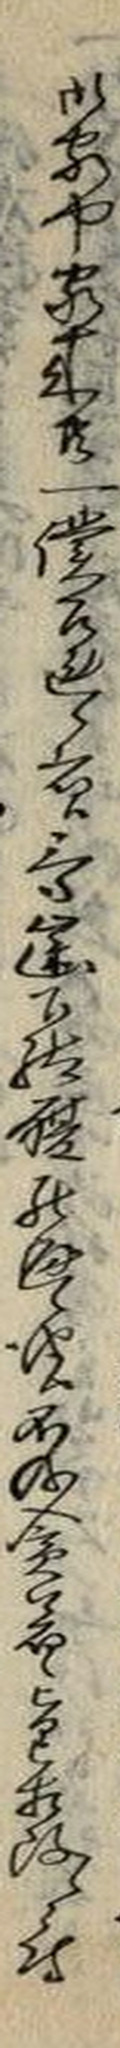御家中家来共一僕召連候者は三ツ歯下駄履罷通候儀は不及貪着候旨被相改候に付
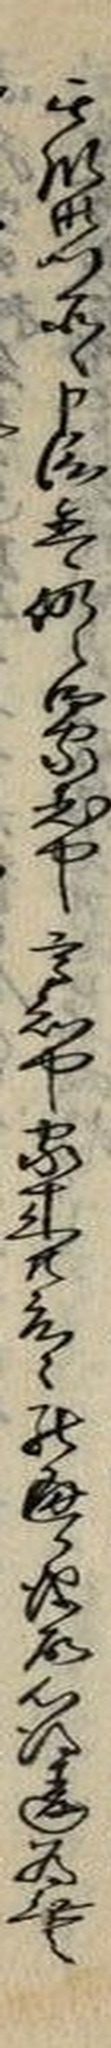其段御門所へ申渡置候仍之御家老中高知中家来共度々罷通候儀故心得違無之
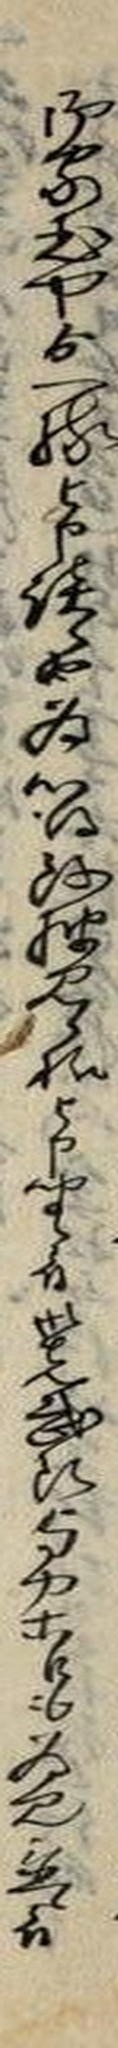御家老中ゟ一統被申談候由為心得致披見候様被申聞候に付御先武頭与力等江も為見置候に付
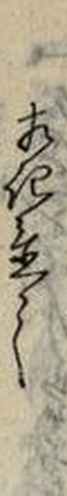相記置之
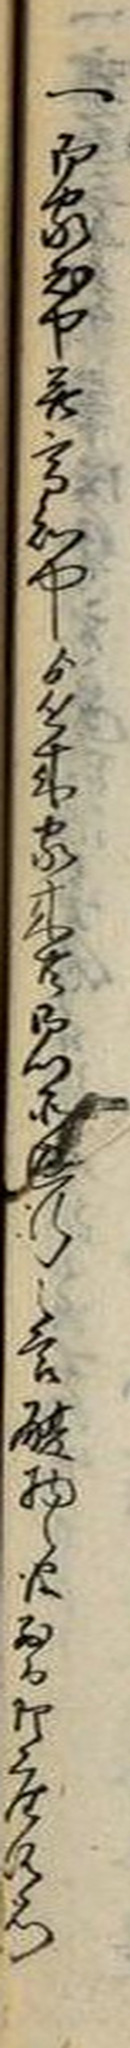一御家老中并高知中ゟ近来家来共御門所通候之節履物之儀別而御座所御門
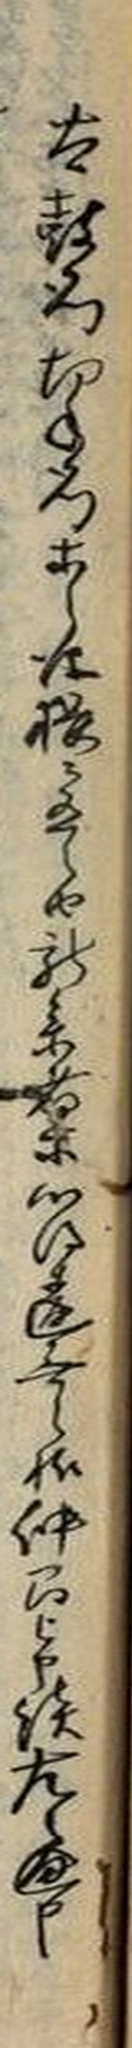太鼓御門切手御門等之儀濫り猥に有之由新参者等心得違無之様仲間被申談左之通申
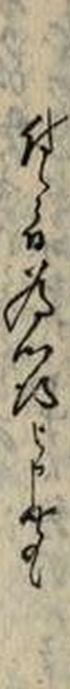付候に付為心得被申聞候
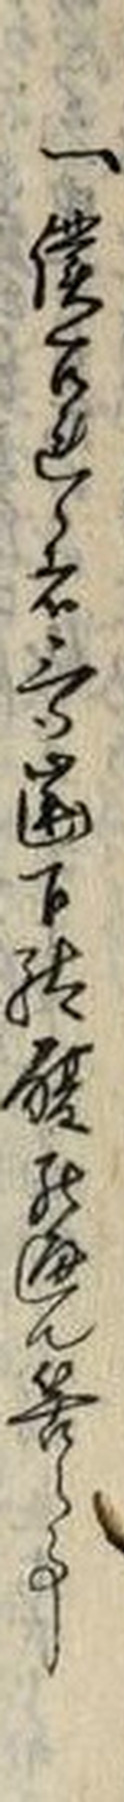一僕召連候者三ツ歯下駄履罷通ル筈之事
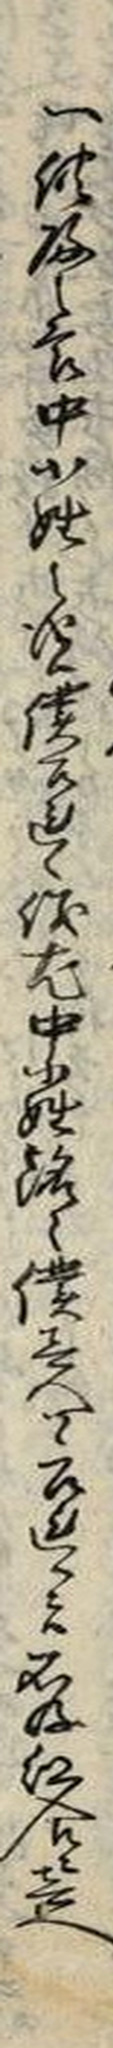一共帰之節中小姓之儀は僕召連候儀尤中小姓銘々僕壱人つゝ召連候に者不及組合に壱人
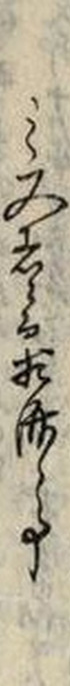之又者に而相済候事
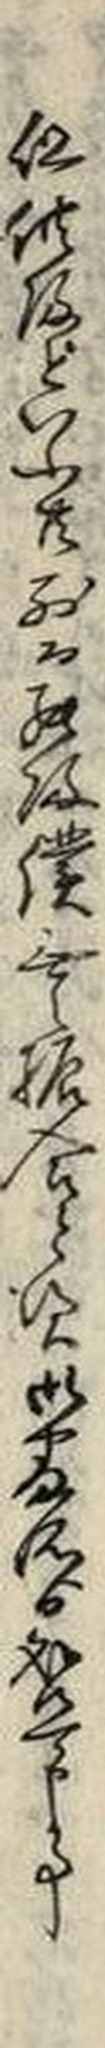但供帰といふ共別而罷帰僕無之振合ニ候得は御番所ゟ咎可申事
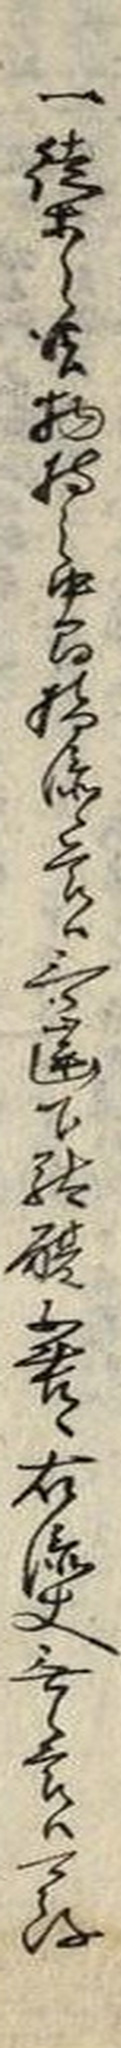一徒等之儀は物持之中間指添候節は三ツ歯下駄履不苦候右添使無之節は可致
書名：御門御櫓之部
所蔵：福井県文書館 Fukui Prefectural Archives
